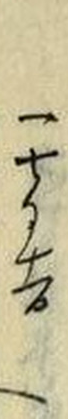一七月十一日
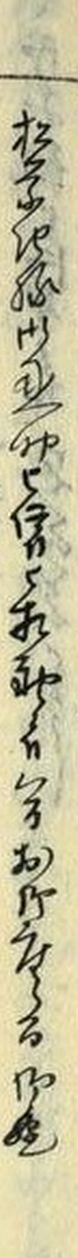松栄院様御用人助被仰付被相勤候ニ付今日於御座之間御逢
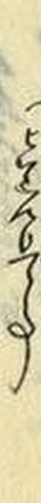被差上候事
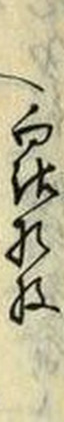白銀拾枚
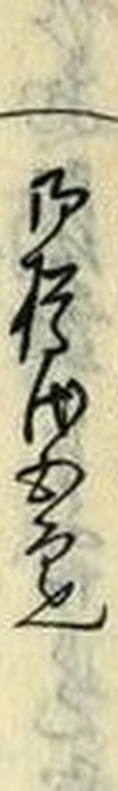御樽代五百疋
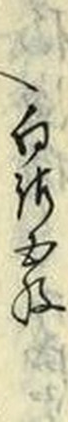白銀五枚
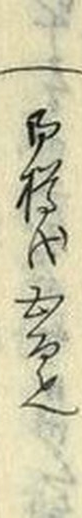御樽代五百疋
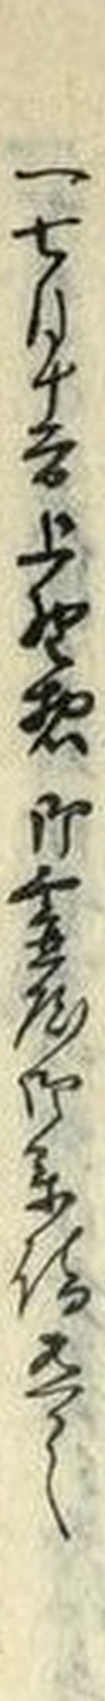一七月十二日上野惣御霊屋御参詣有之
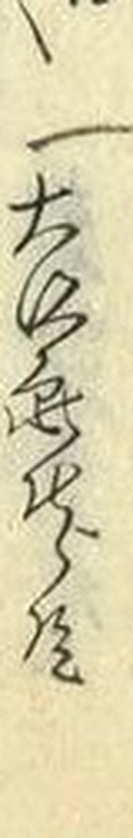大沢亀次郎殿
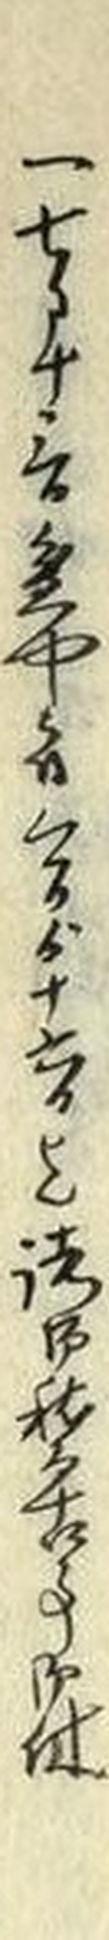一七月十三日盆中ニ付今日ゟ十六日迄諸御稽古事御休
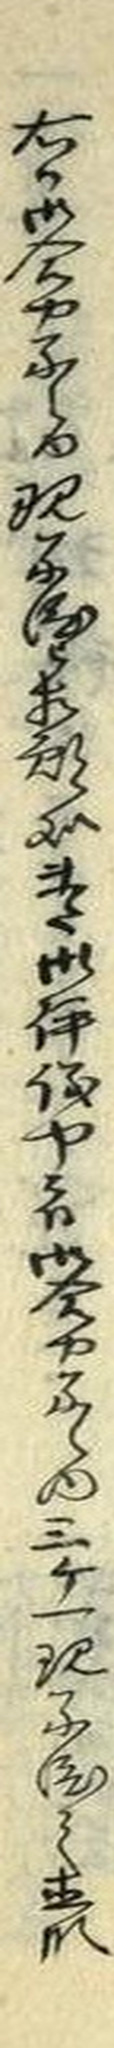右御合力米之内現米渡被相願候処未た御評議中ニ付御合力米之内三ケ一現米渡之直段
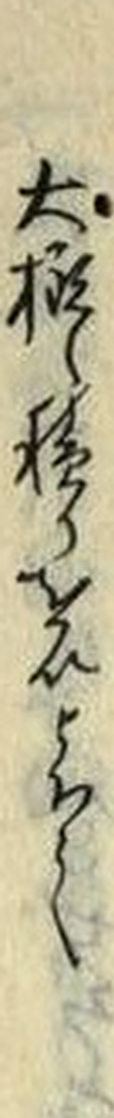大概之積りを以被下之

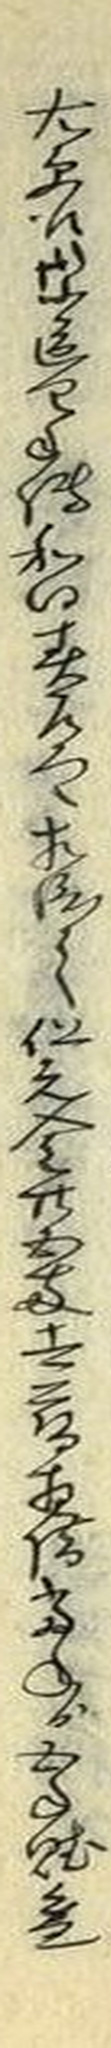右受取御小道具手伝和田春左衛門へ相渡之但元金廿五両去暮拝借当年ゟ五年賦盆
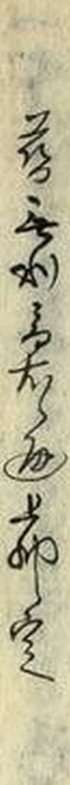暮無利ニ而右之通上納之定
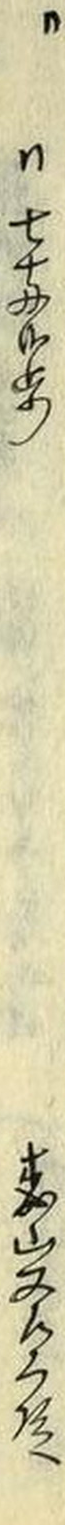同同七両弐歩森山又左衛門殿
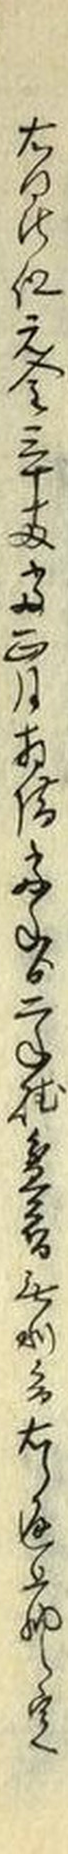右同断但元金三十両当正月拝借当年ゟ二年賦盆暮無利ニ而右之通上納之定
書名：少傅日録抄（斉善付側向頭取日記、在府）
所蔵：福井県文書館 Fukui Prefectural Archives
